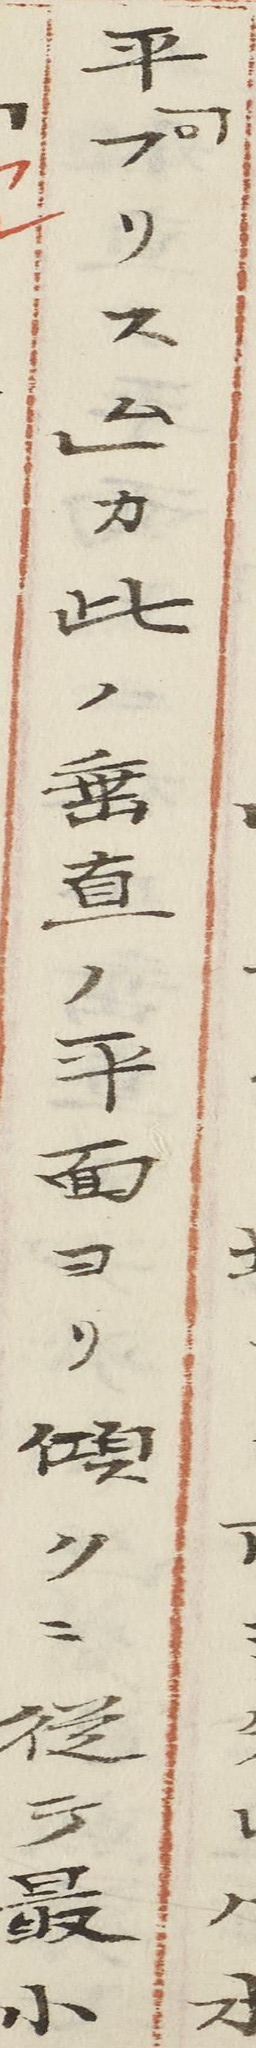平「プリスム」カ此ノ垂直ノ平面ヨリ傾クニ従テ最小
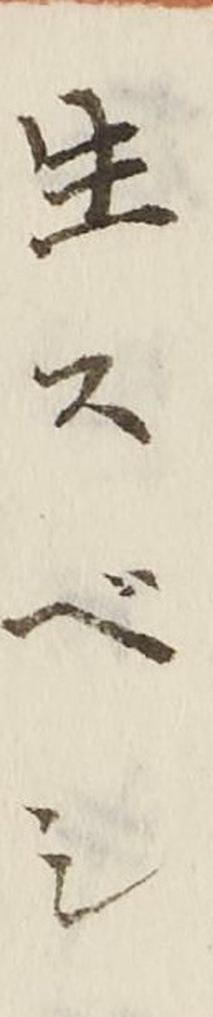生スベシ
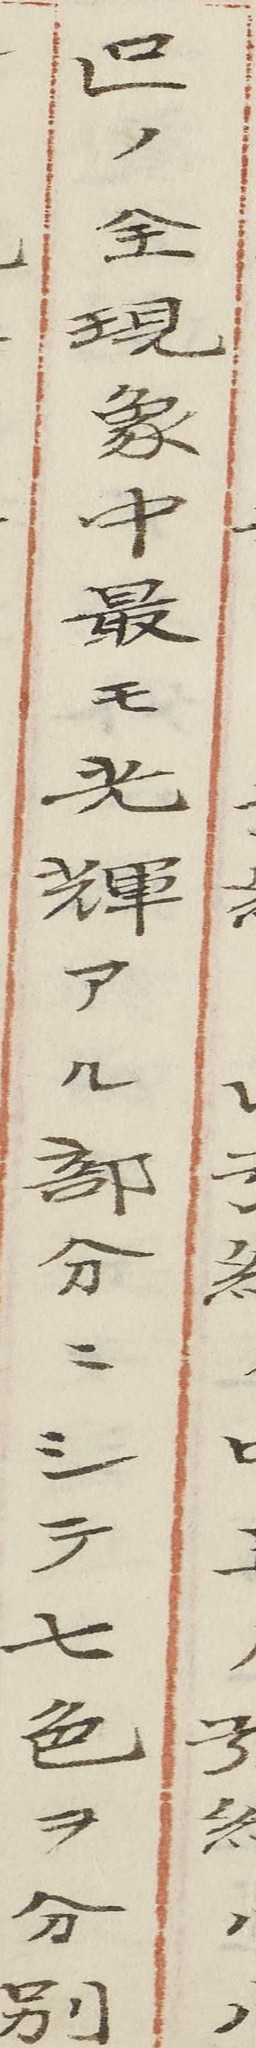ロ」ノ全現象中最モ光輝アル部分ニシテ七色ヲ分別
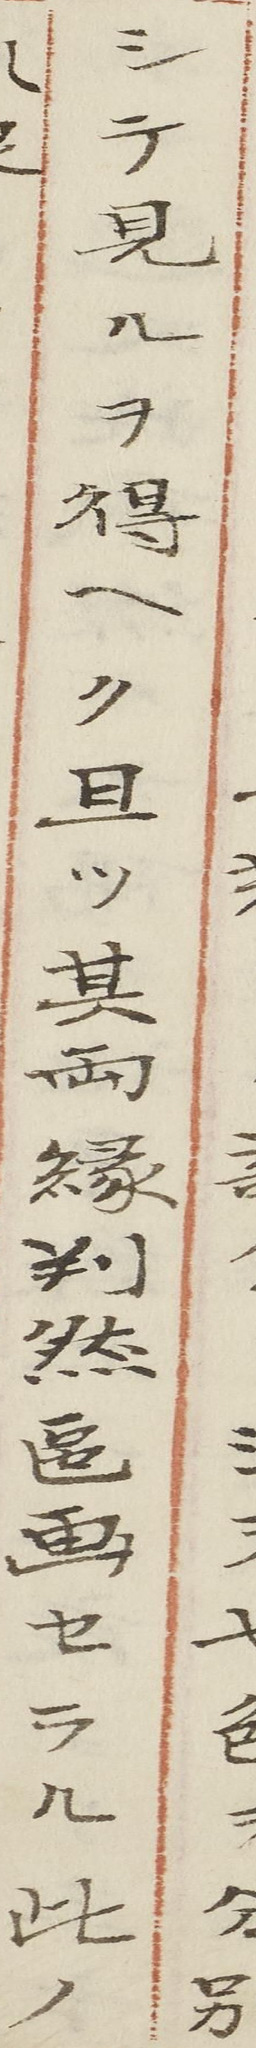シテ見ルヲ得ヘク且ツ其両縁判然区画セラル此ノ
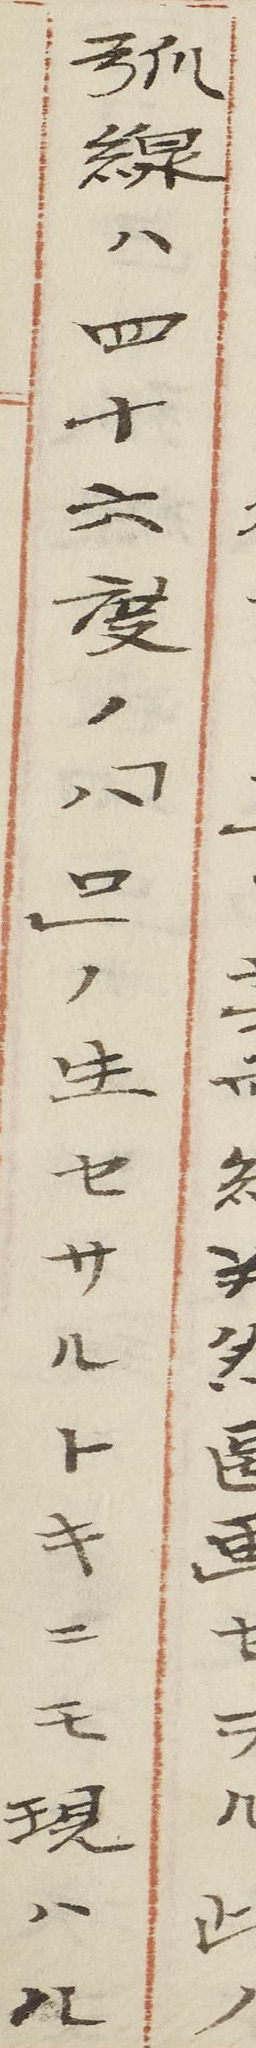弧線ハ四十六度ノ「ハロ」ノ生セサルトキニモ現ハル

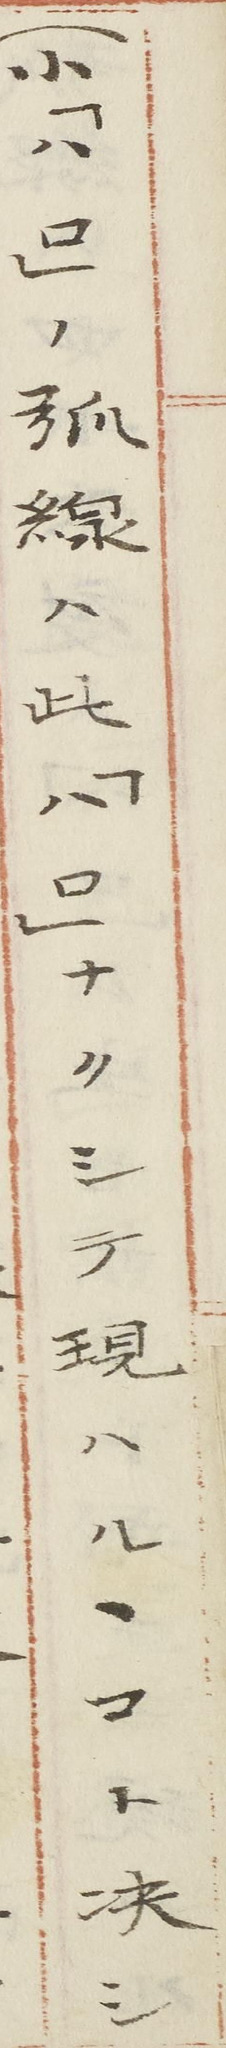（小「ハロ」ノ弧線ハ此「ハロ」ナクシテ現ハルヽコト決シ
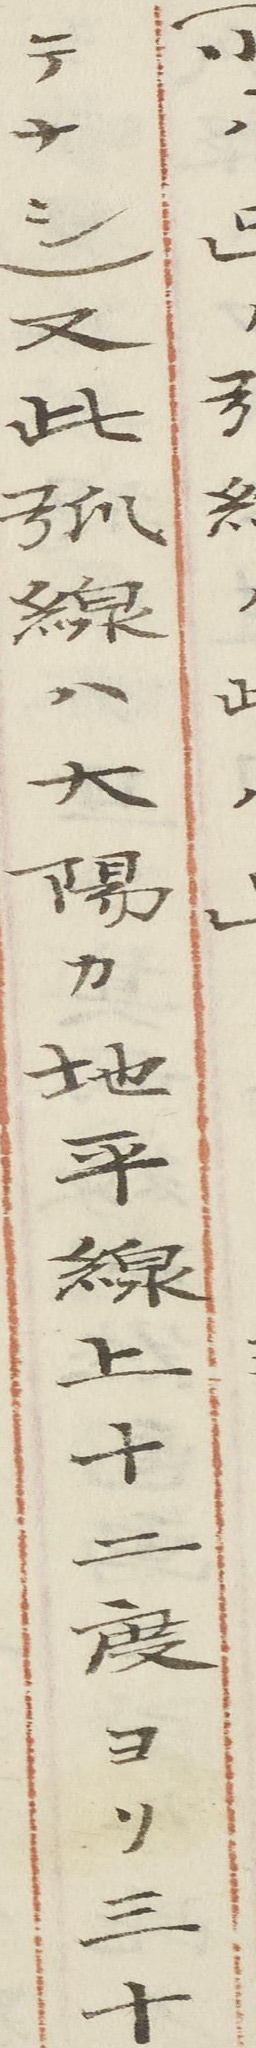テナシ）又此弧線ハ大陽カ地平線上十二度ヨリ三十
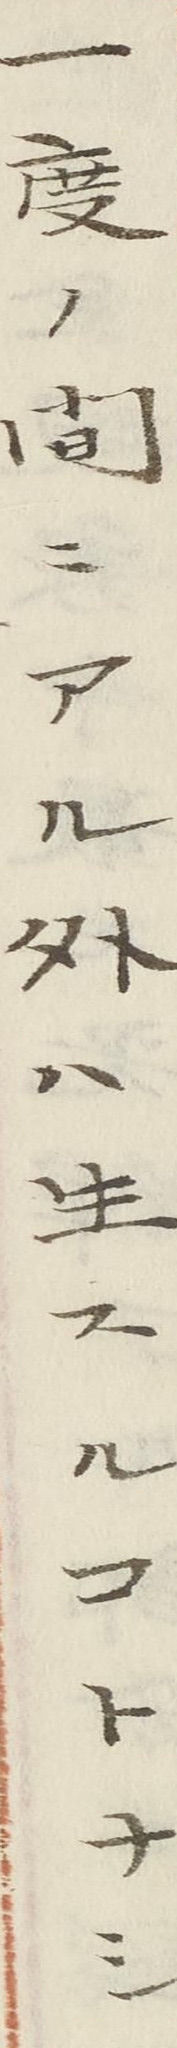一度ノ間ニアル外ハ生スルコトナシ
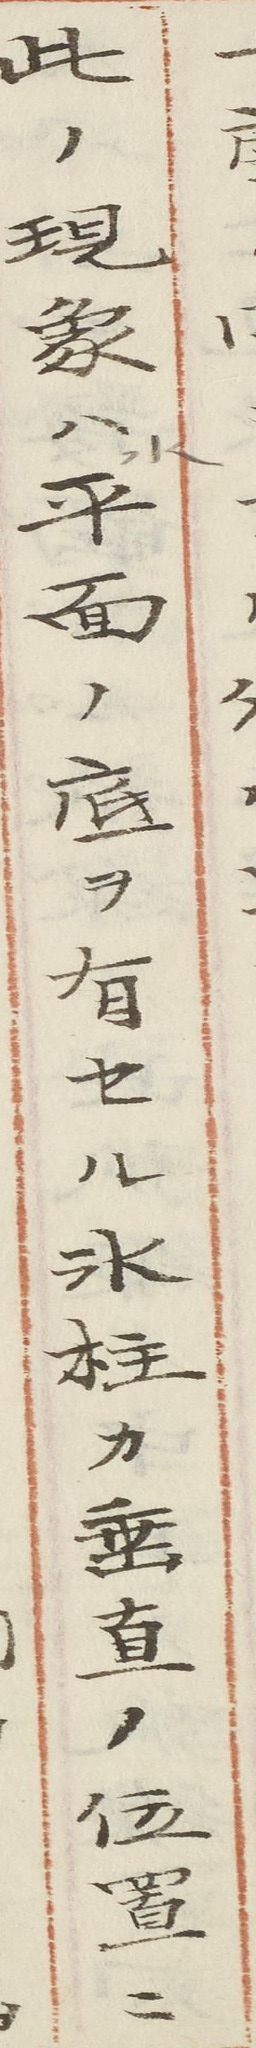此ノ現象ハ水平面ノ底ヲ有セル氷柱カ垂直ノ位置ニ
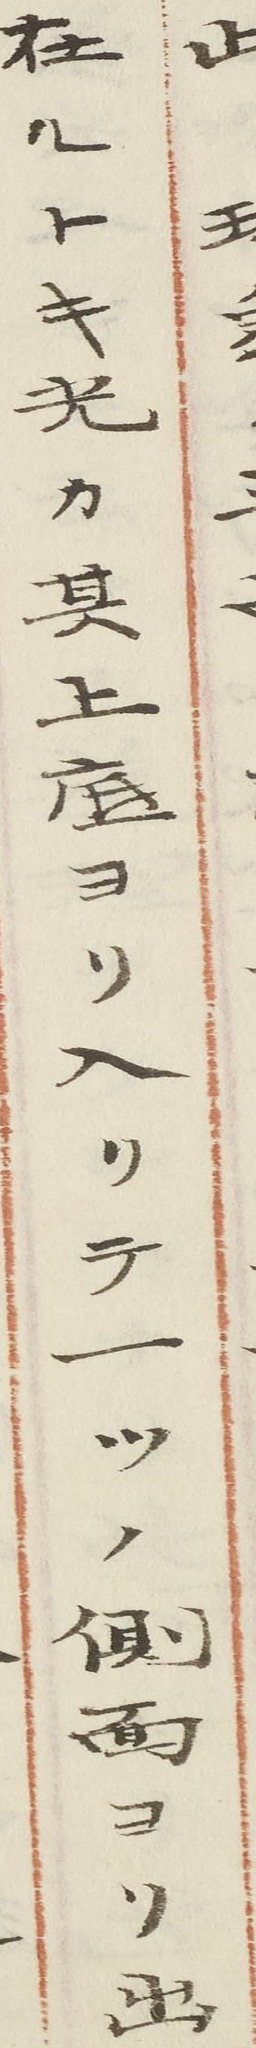在ルトキ光カ其上底ヨリ入リテ一ツノ側面ヨリ出
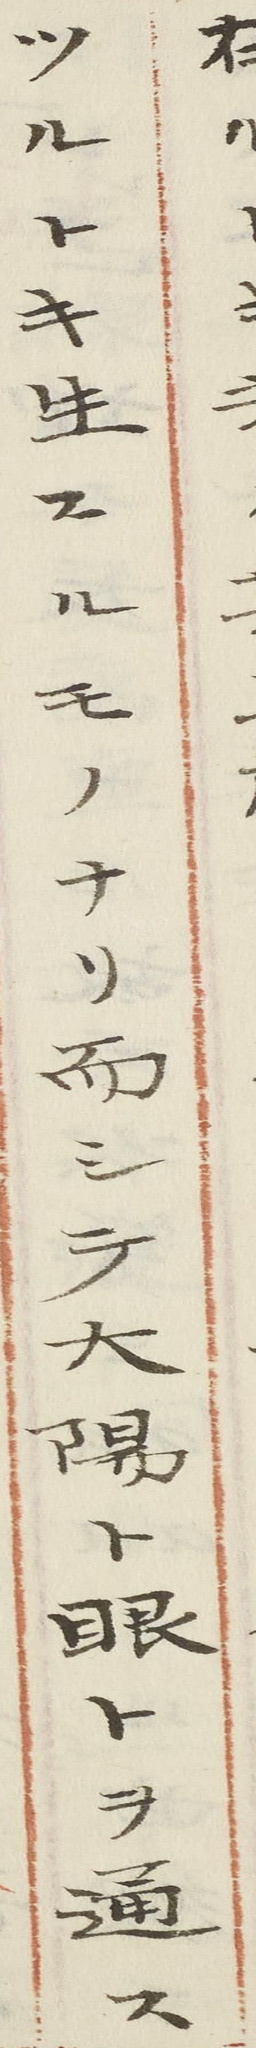ツルトキ生スルモノナリ而シテ大陽ト眼トヲ通ス
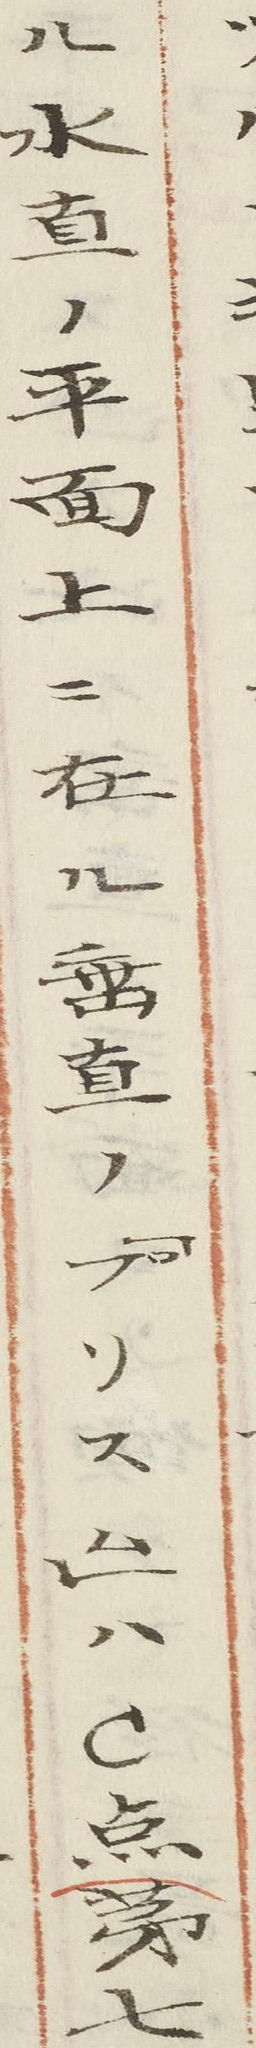ル水直ノ平面上ニ在ル垂直ノ「プリスム」ハＣ点（第七
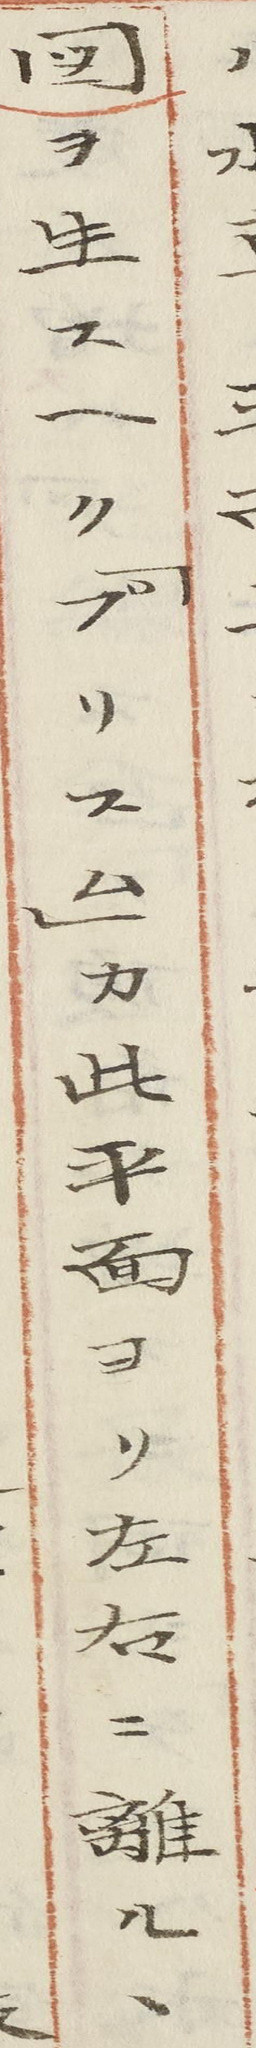図）ヲ生スヘク「プリスム」カ此平面ヨリ左右ニ離ルヽ
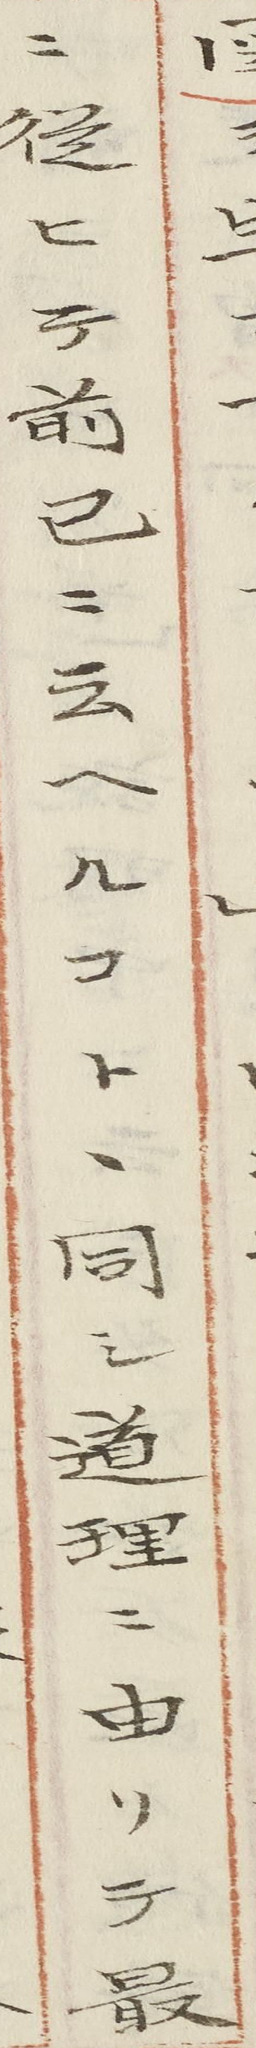ニ従ヒテ前已ニ云ヘルコトヽ同シ道理ニ由リテ最
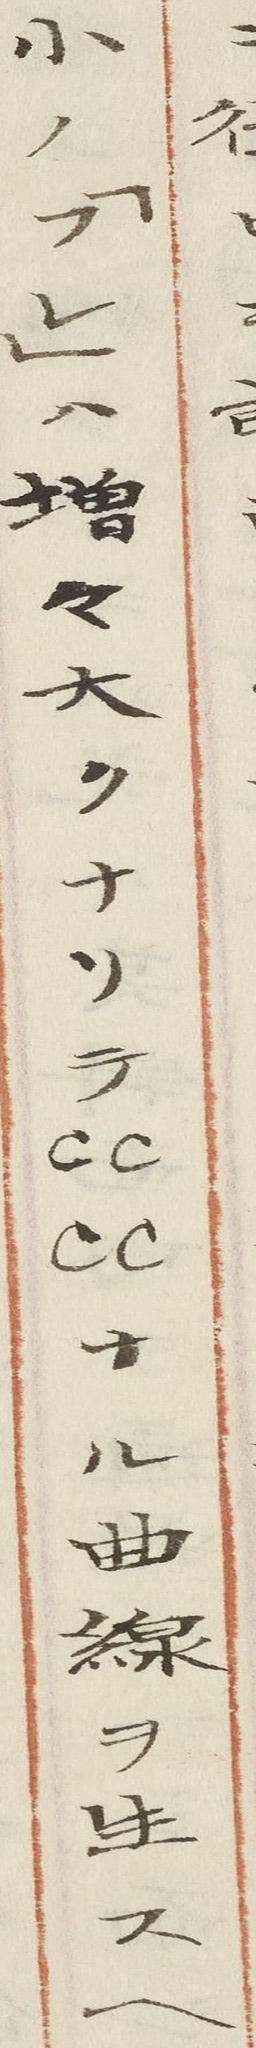小ノ「フレ」ハ増々大クナリテＣＣＣＣナル曲線ヲ生スヘ
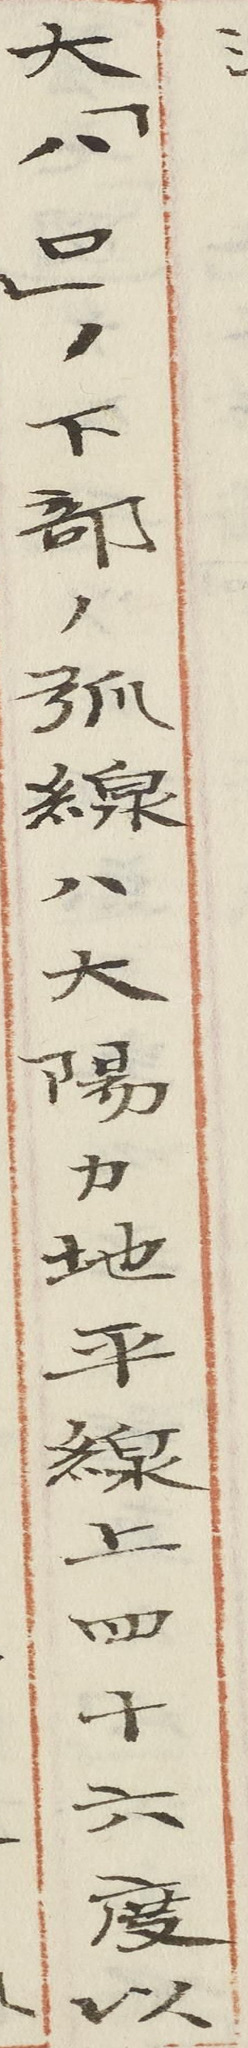大「ハロ」ノ下部ノ弧線ハ大陽カ地平線上四十六度以
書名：虹及ハロノ説明
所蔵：東京大学地震研究所図書室 Earthquake Research Institute Library, The University of Tokyo, JAPAN
